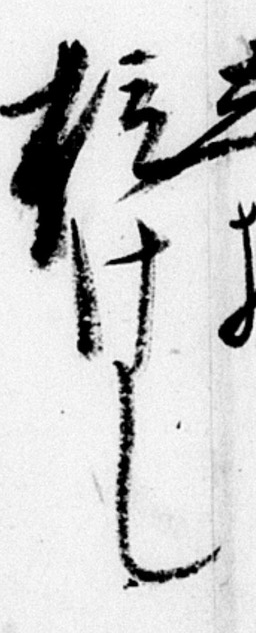粒けし

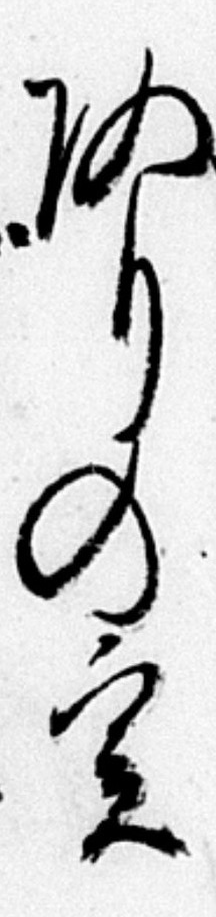ありの実
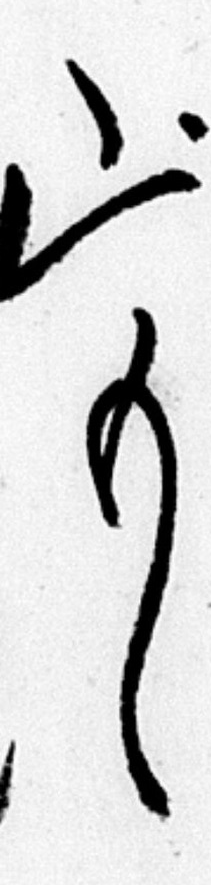山もゝ
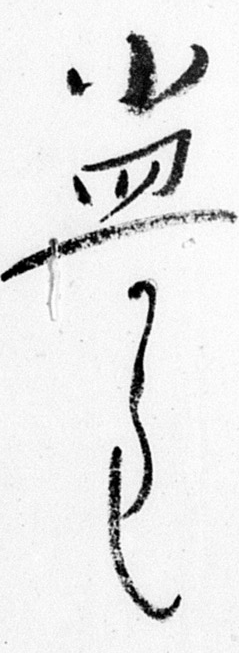小皿からし
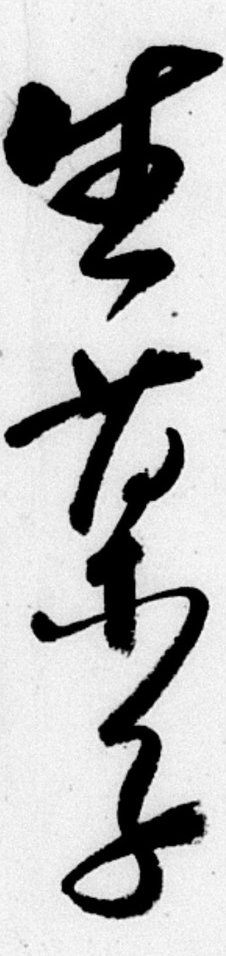生菓子
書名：（宝暦十年）卯月廿日献立
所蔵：徳島県立図書館
